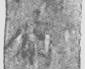六
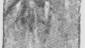十
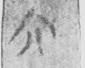六
